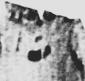○（召）
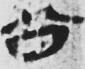公
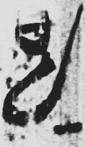也
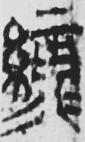綠
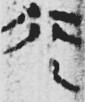衣
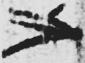之
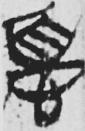憂
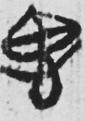思
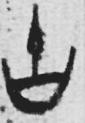古
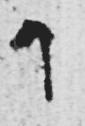人
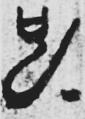也
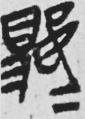燕燕
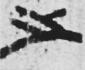之
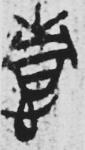情
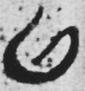㠯（以）
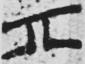亓（其）
